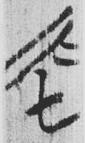帀（師）
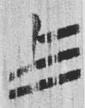上（尚）
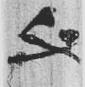父
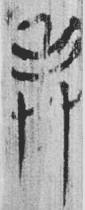奉
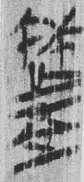箸（書）
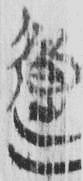道
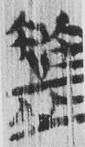箸（書）
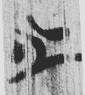之
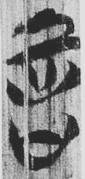言
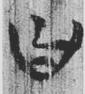曰
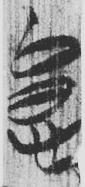怠
